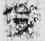月
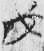戊
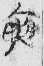寅
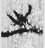之
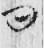日
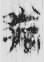○（尚）
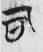司
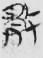敗
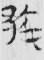○（蔡）
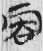丙
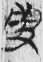受
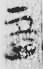○（期）
